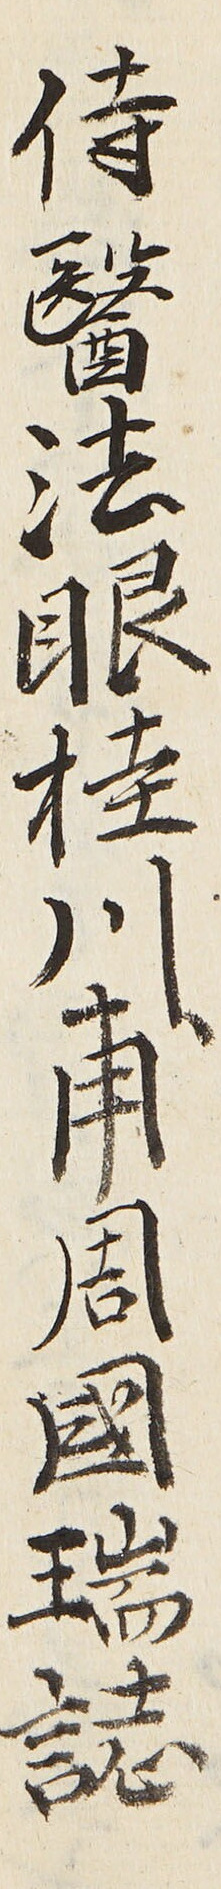侍医法眼桂川甫周国瑞誌
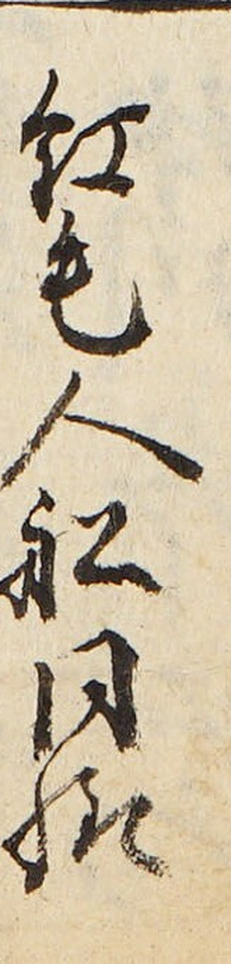紅毛人船同様
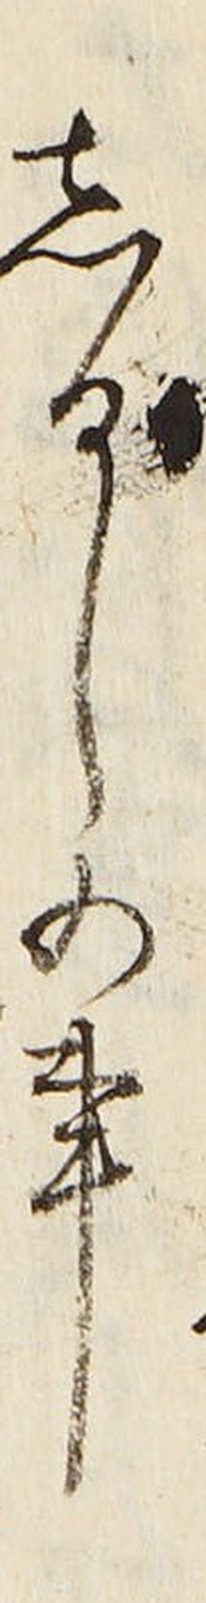しるしの事
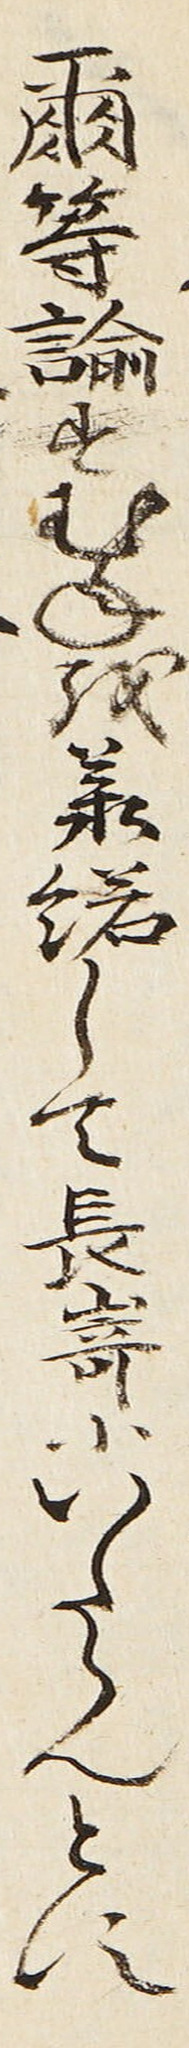爾等論しむねを承諾して長崎にいたらんとす
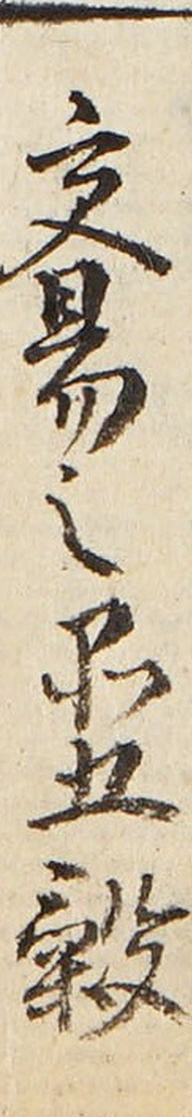交易之品五穀
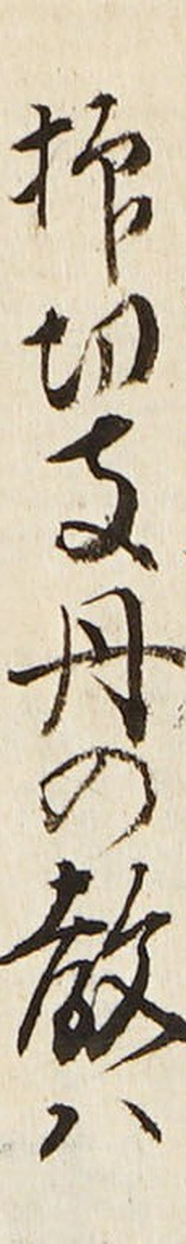抑切支丹の教は
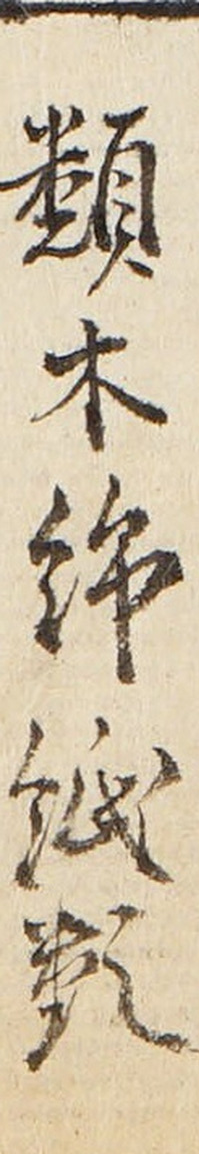類木綿紙類
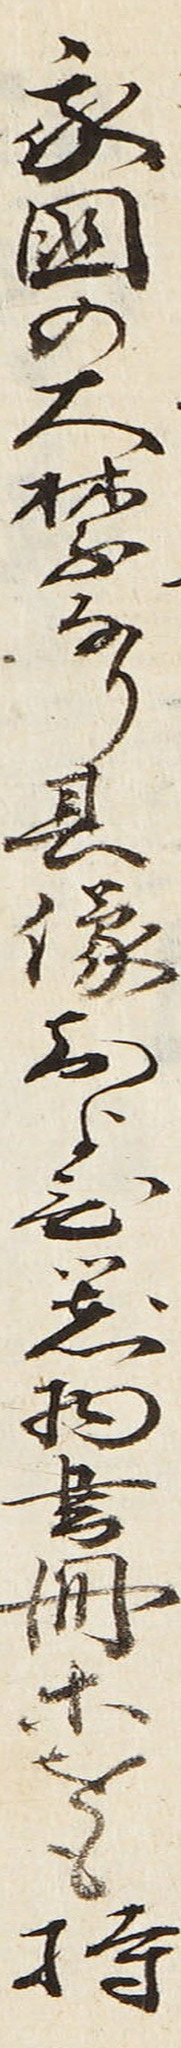我国の大禁なり其像およひ器物書冊等をも持
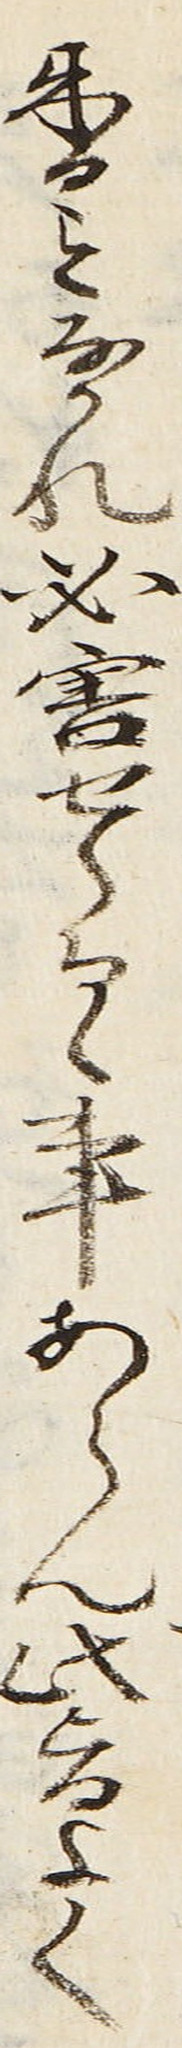来ることなかれ必害せらるゝ事あらん此旨よく
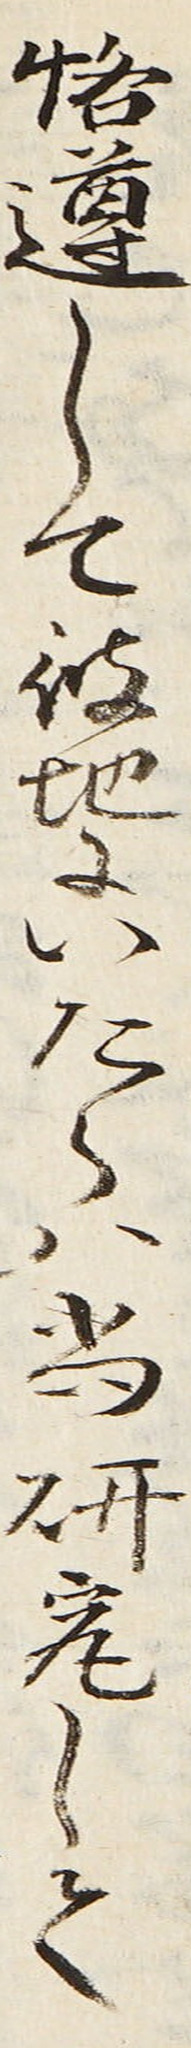恪遵して彼地にいたらは尚研究して
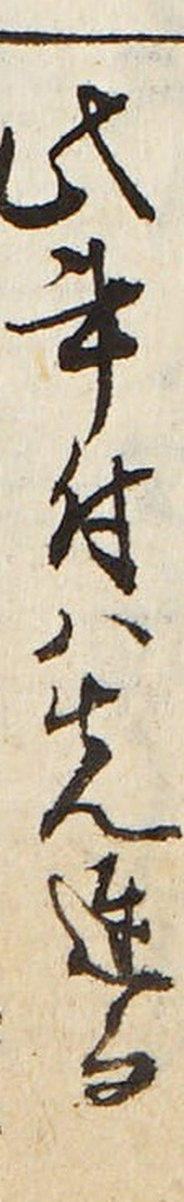此書付は先達て
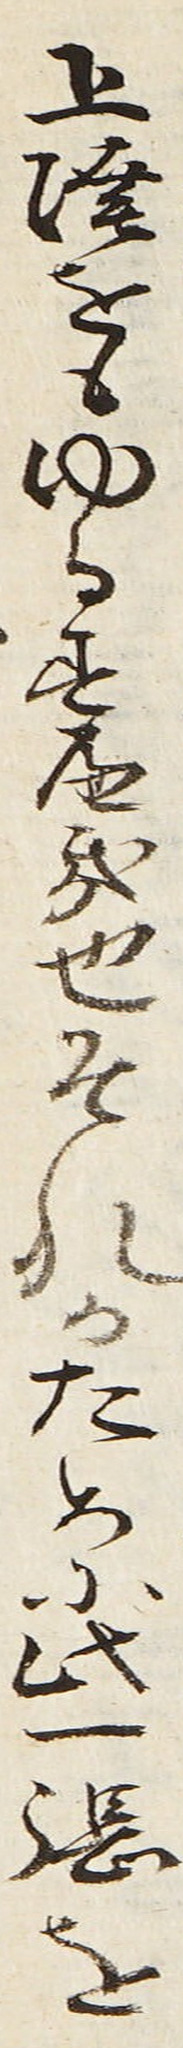上陸をもゆるすへき也それかために此一張を
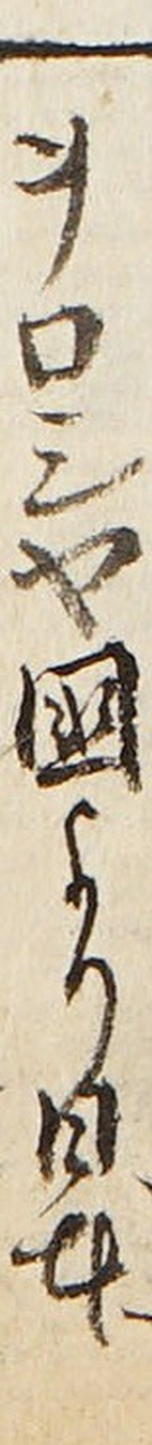ヲロシヤ国より日本へ
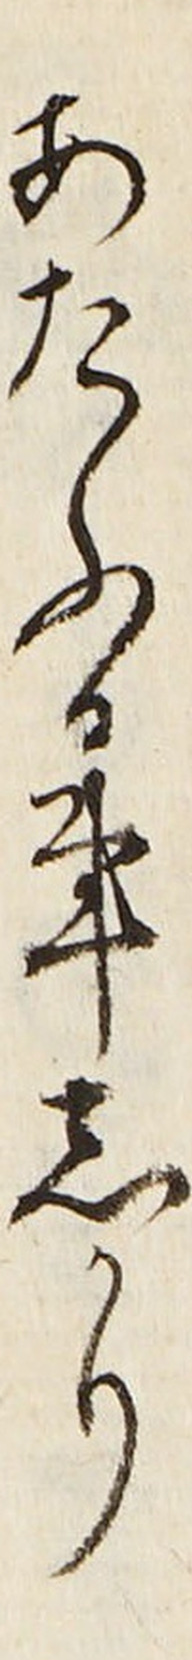あたふる事しかり
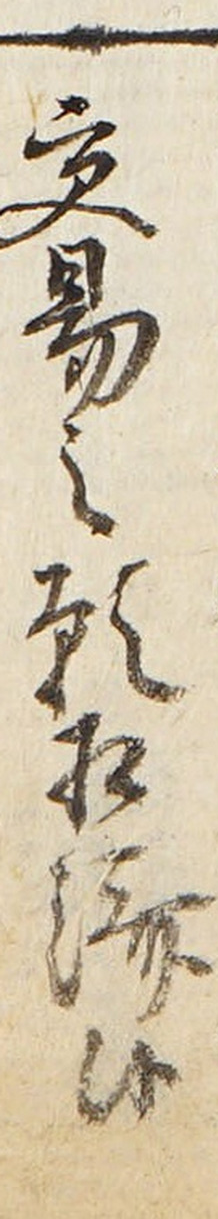交易之願相済候
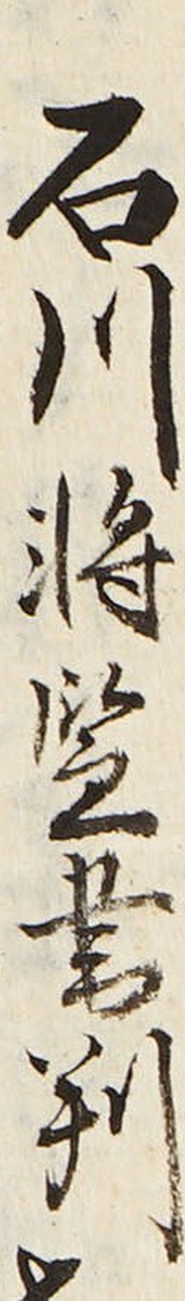石川将監書判
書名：漂民御覧之記
